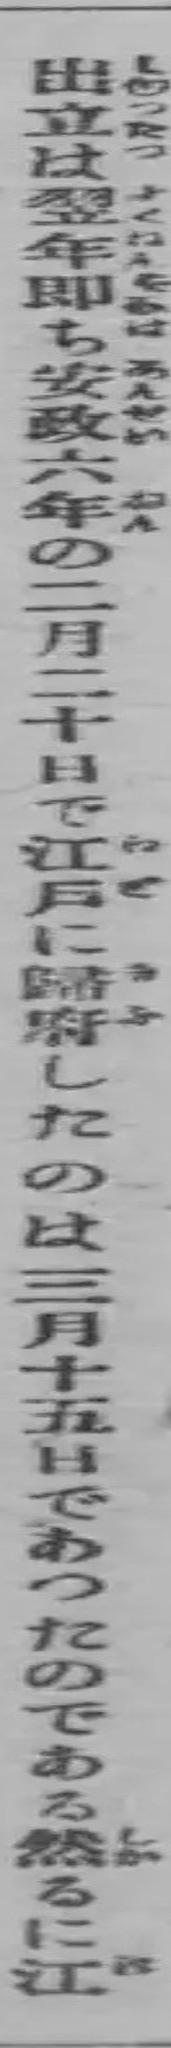出立は翌年即ち安政六年の二月二十日で江戸に帰府したのは三月十五日であつたのである然るに江
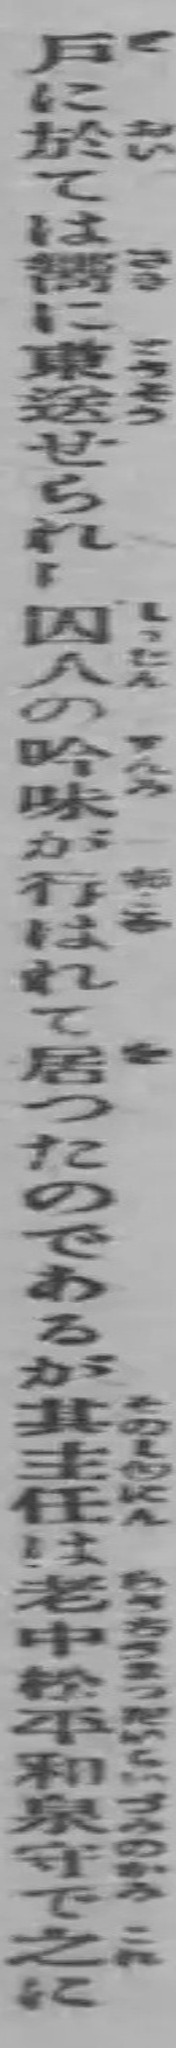戸に於ては曩に東送せられし囚人の吟味が行はれて居つたのであるが其主任は老中松平和泉守で之に

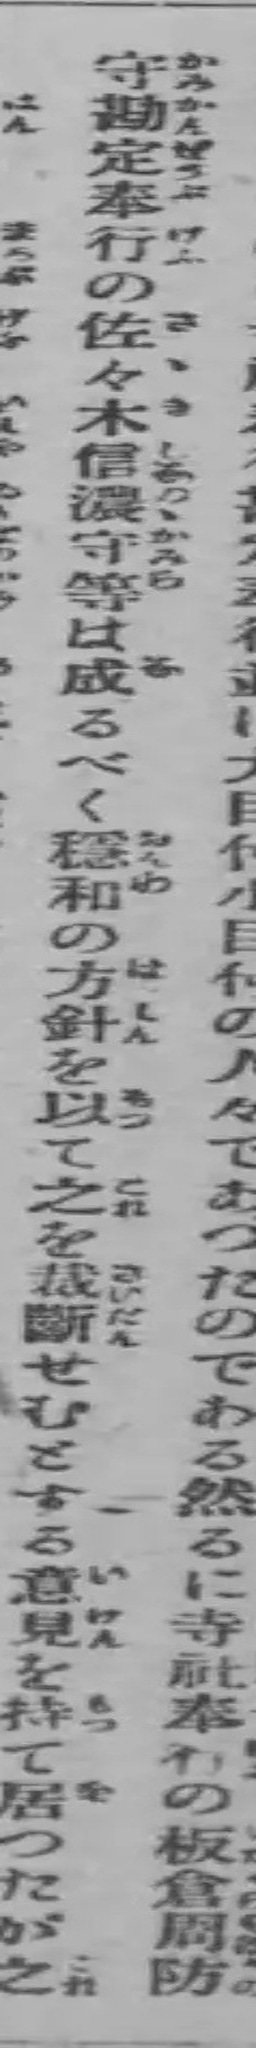守勘定奉行の佐々木信濃守等は成るべく穏和の方針を以て之を裁断せむとする意見を持て居つたが之
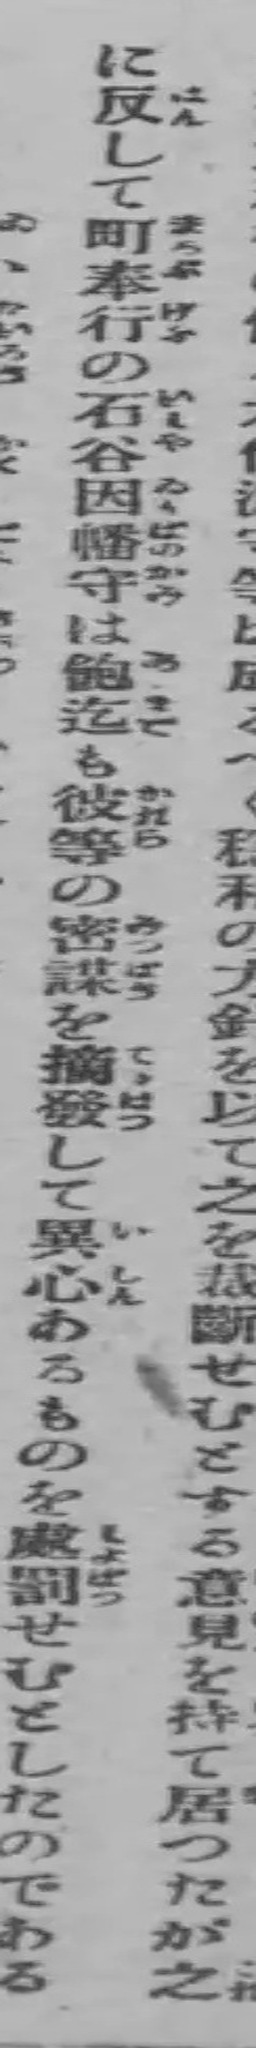に反して町奉行の石谷因幡守は飽迄も彼等の密謀を摘発して異心あるものを処罰せむとしたのである
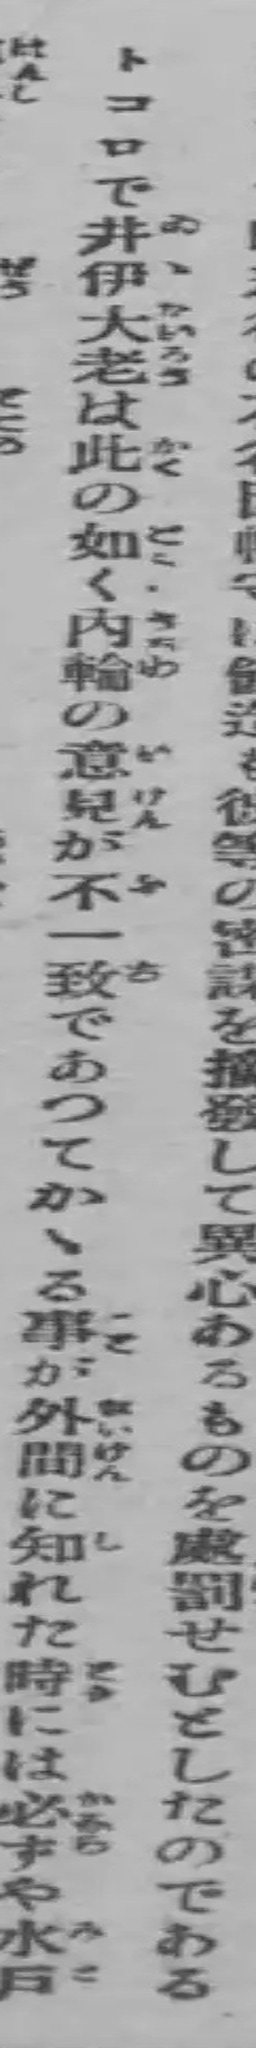トコロで井伊大老は此の如く内輪の意見が不一致であつてかゝる事が外間に知れた時には必ずや水戸
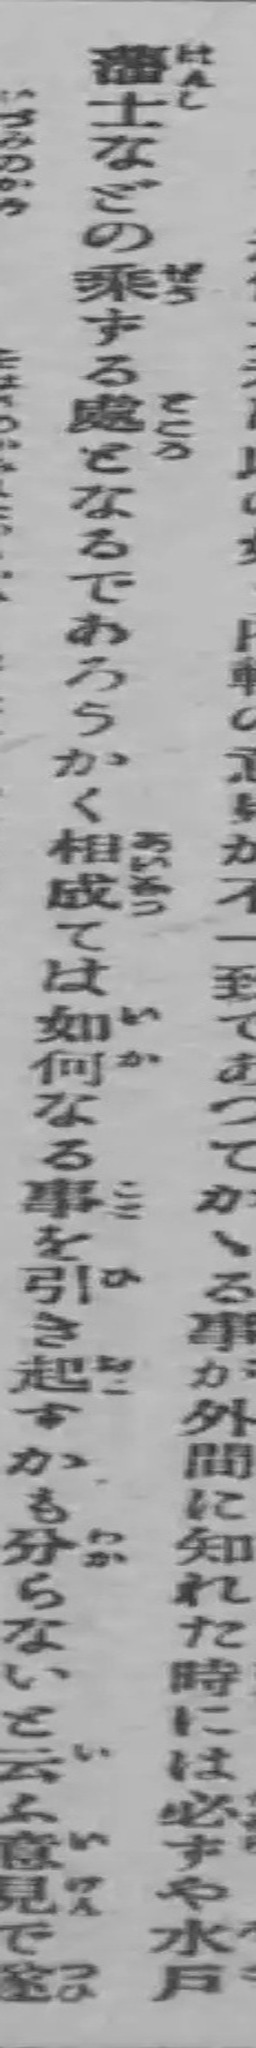藩士などの乗ずる処となるであろうかく相成ては如何なる事を引き起すかも分らないと云ふ意見で遂
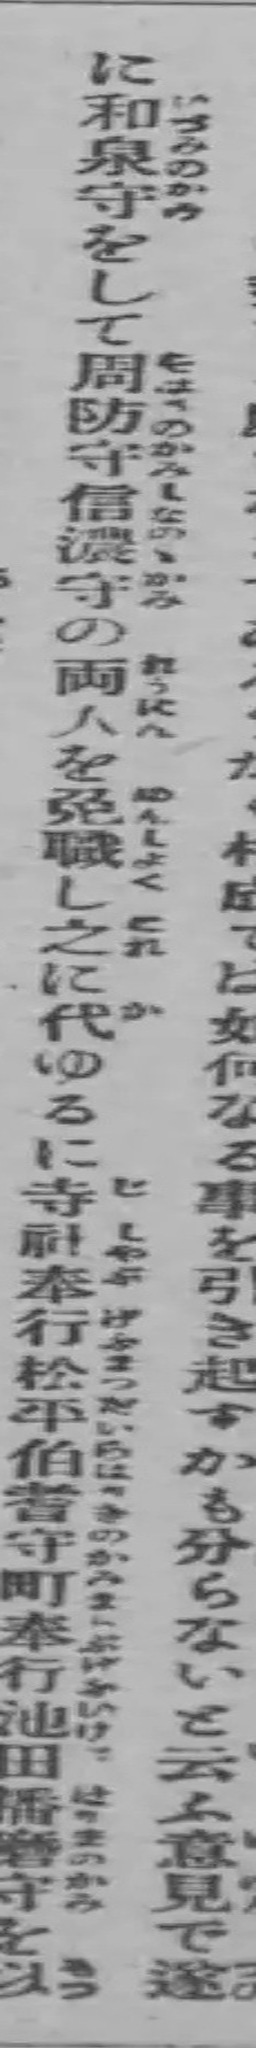に和泉守をして周防守信濃守の両人を免職し之に代ゆるに寺社奉行松平伯耆守町奉行池田播磨守を以
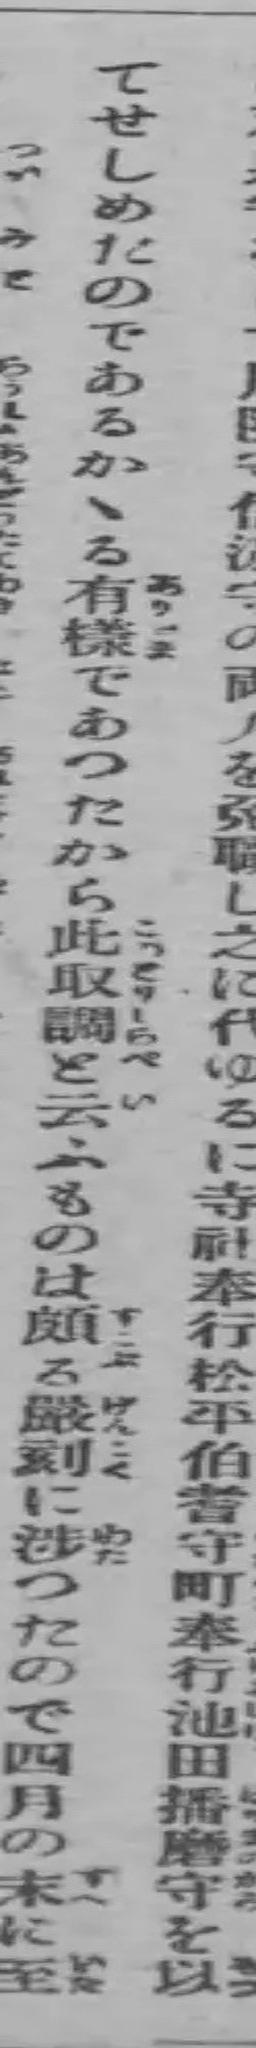てせしめたのであるかゝる有様であつたから此取調と云ふものは頗る厳刻に渉つたので四月の末に至
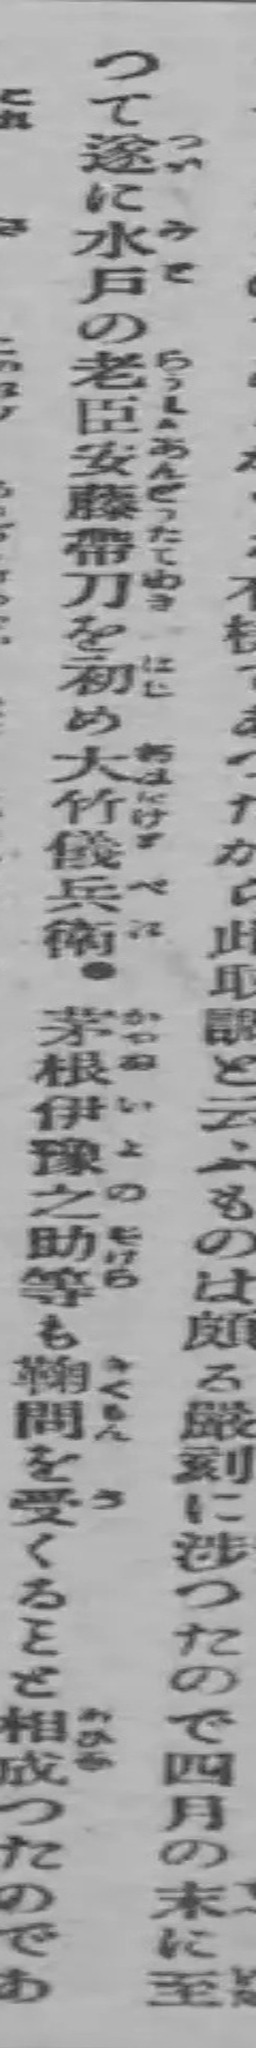つて遂に水戸の老臣安藤帯刀を初め大竹儀兵衛、茅根伊予之助等も鞠問を受くることと相成つたのであ
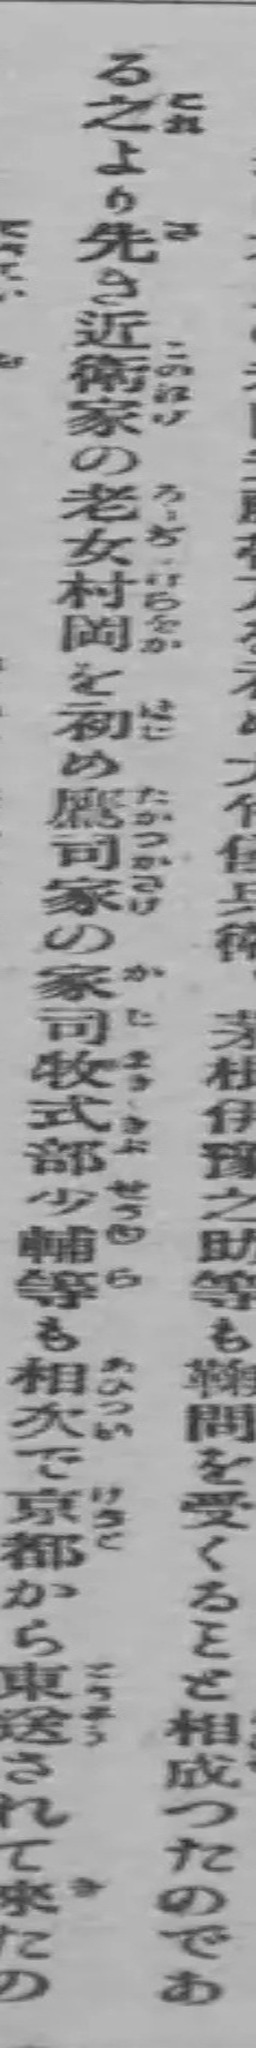る之より先き近衛家の老女村岡を初め鷹司家の家司牧式部少輔等も相次で京都から東送されて来たの
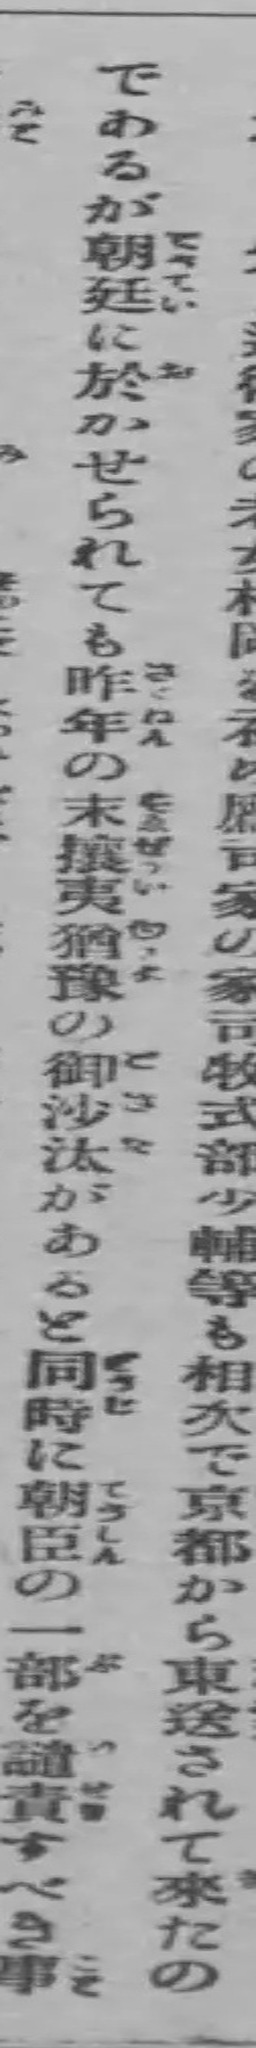であるが朝廷に於かせられても昨年の末攘夷猶予の御沙汰があると同時に朝臣の一部を譴責すべき事
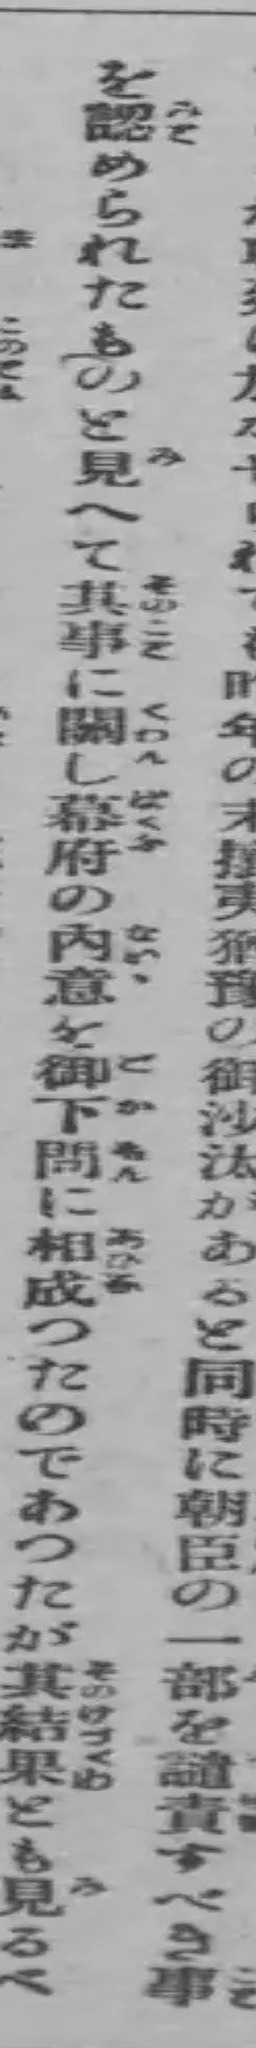を認められたものと見へて其事に関し幕府の内意を御下問に相成つたのであつたが其結果とも見るべ
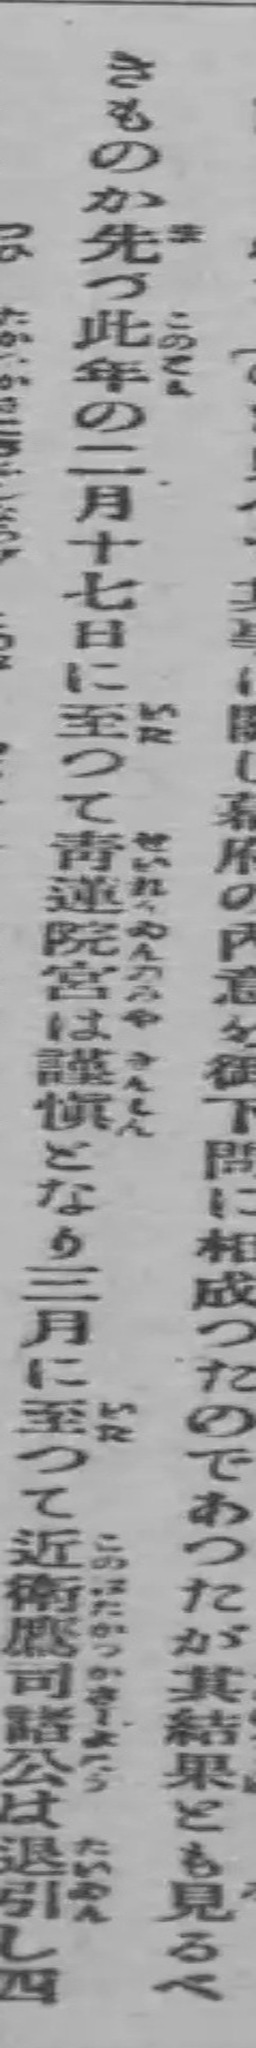きものか先づ此年の二月十七日に至つて青蓮院宮は謹慎となり三月に至つて近衛鷹司諸公は退引し四
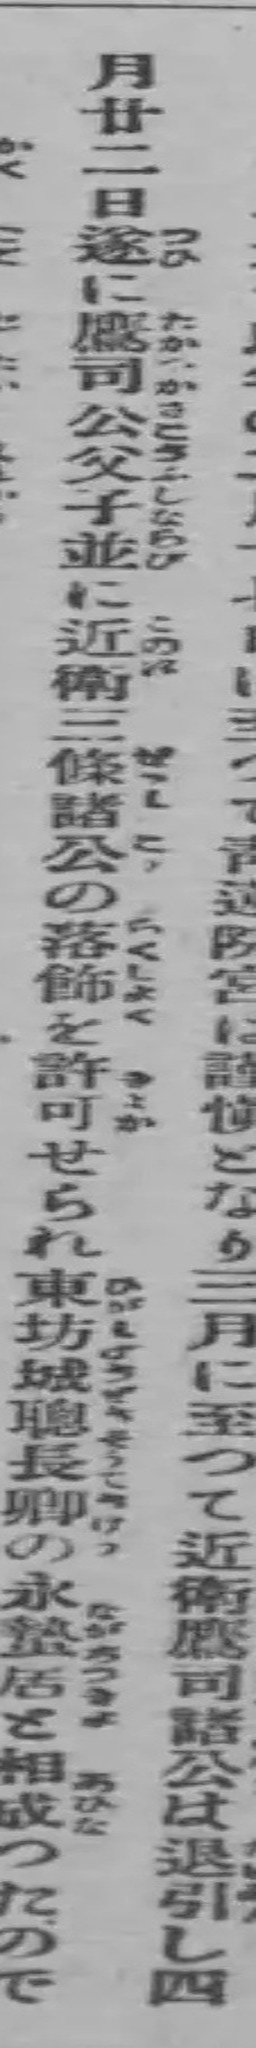月廿二日遂に鷹司公父子並に近衛三条諸公の落飾を許可せられ東坊城聰長卿の永蟄居と相成つたのであ
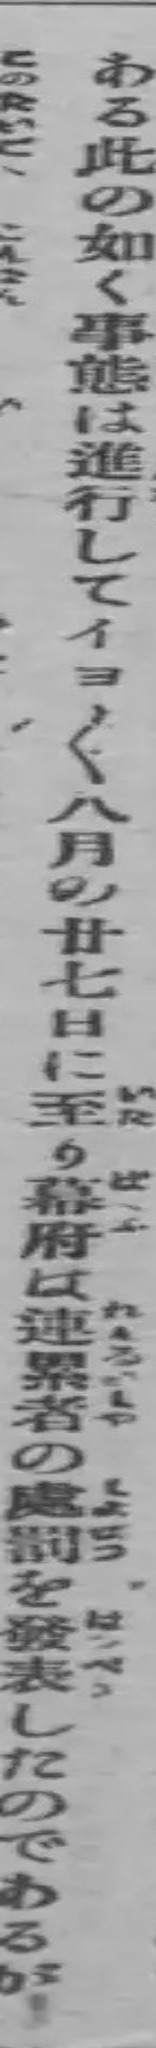ある此の如く事態は進行してイヨ〳〵八月の廿七日に至り幕府の連累者の処罰を発表したのであるが
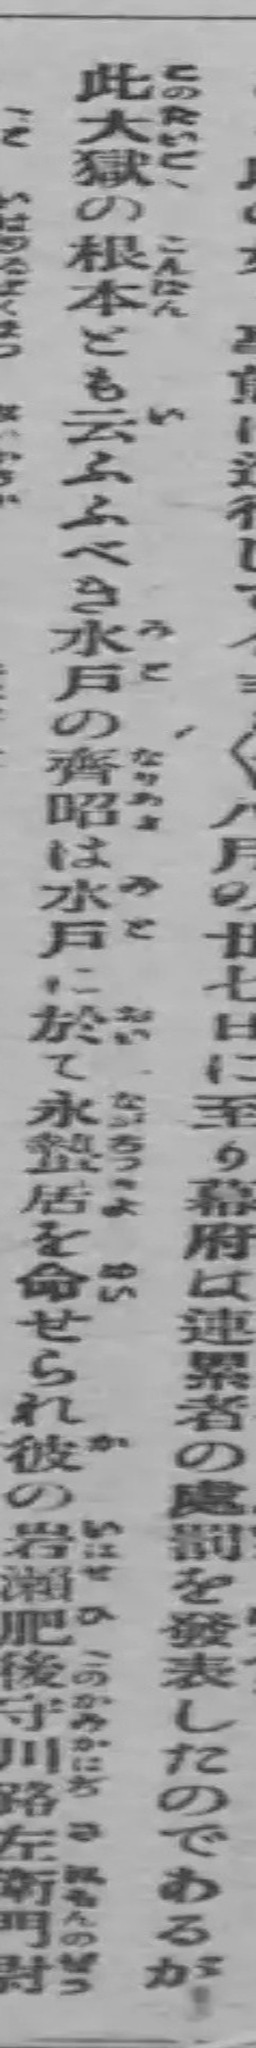此大獄の根本とも云ふふべき水戸の斉昭は水戸に於て永蟄居を命せられ彼の岩瀬肥後守川路左衛門尉
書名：豊橋市史談
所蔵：国立国会図書館 National Diet Library, JAPAN
